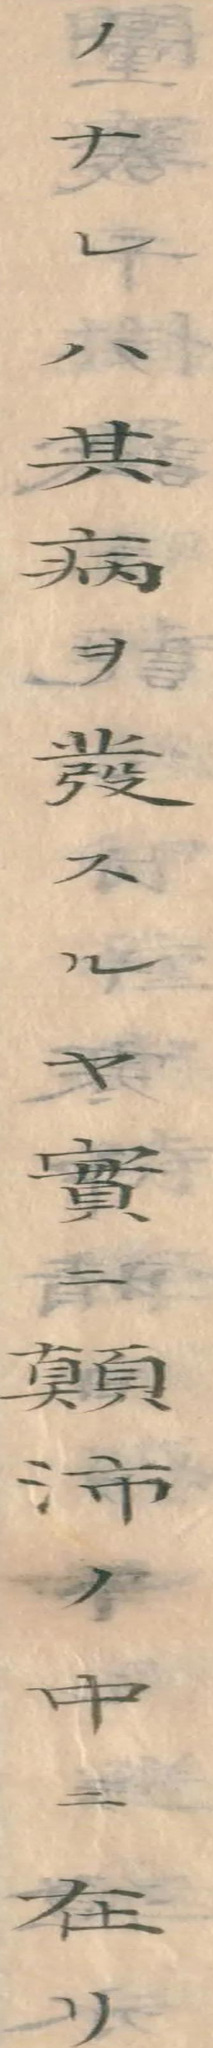ノナレハ其病ヲ発スルヤ実ニ顛沛ノ中ニ在リ
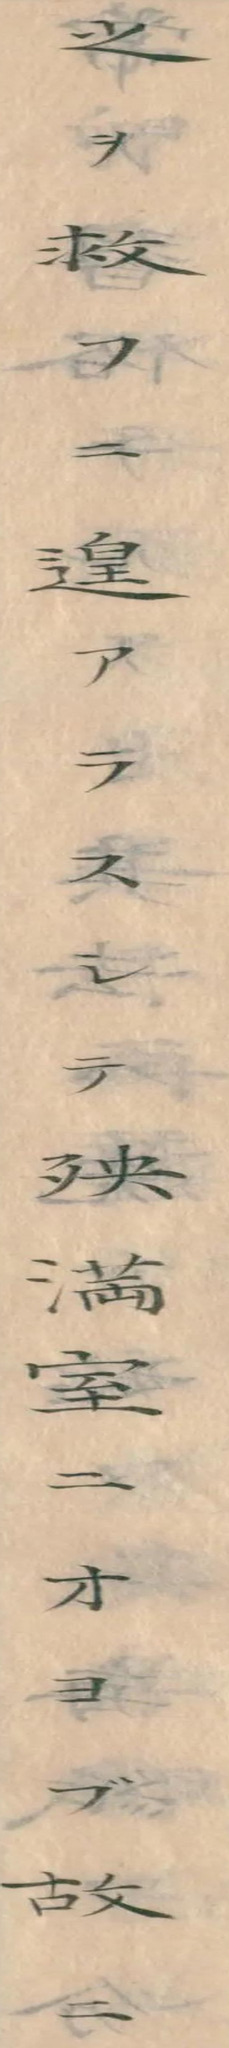之ヲ救フニ遑アラスシテ殃満室ニオヨブ故ニ
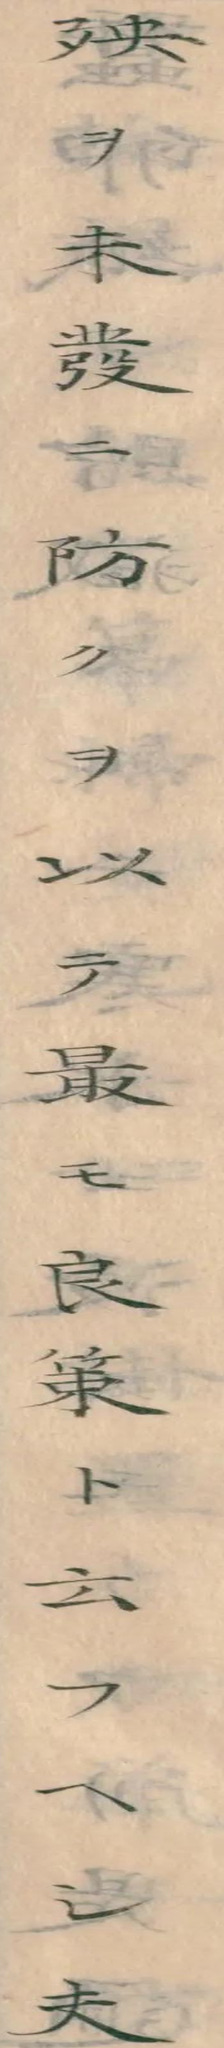殃ヲ未発ニ防クヲ以テ最モ良策ト云フヘシ夫
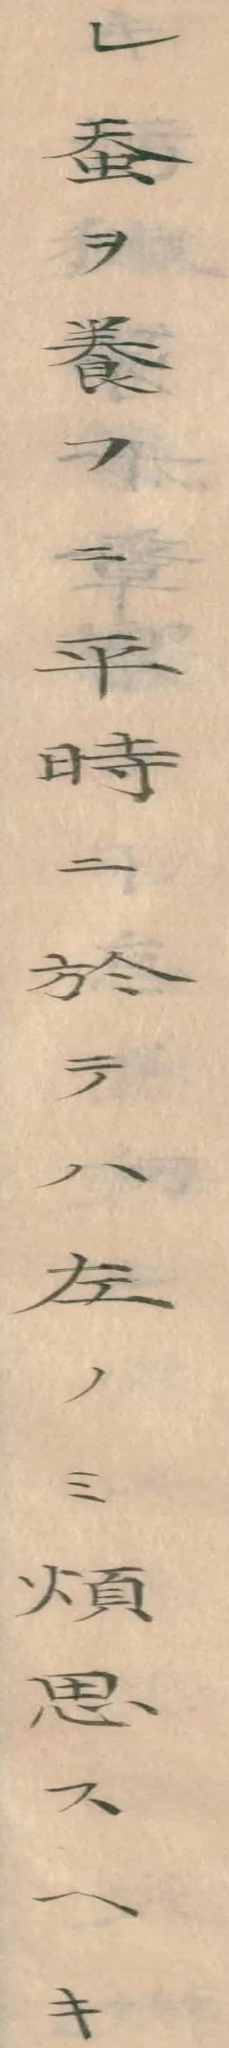レ蚕ヲ養フニ平時ニ於テハ左ノミ煩思スヘキ
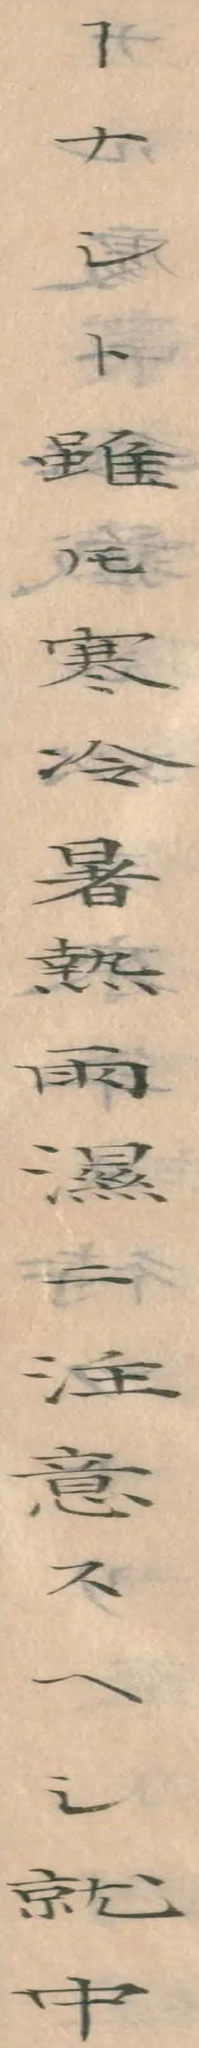コトナシト雖トモ寒冷暑熱雨湿ニ注意スヘシ就中
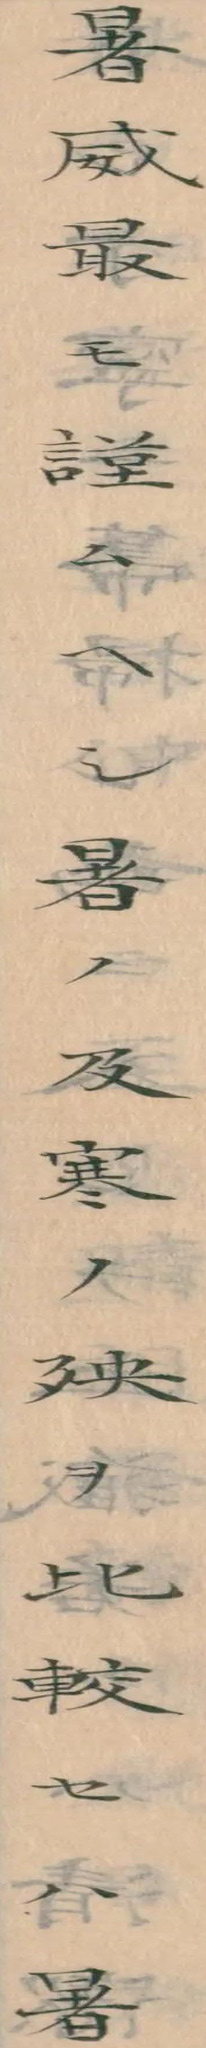暑威最モ謹ムヘシ暑ノ及寒ノ殃ヲ比較セハ暑
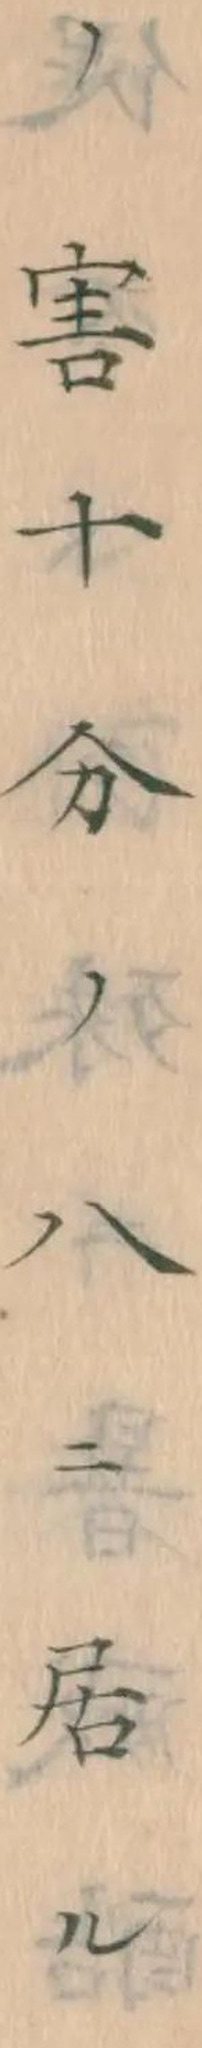ノ害十分ノ八ニ居ル
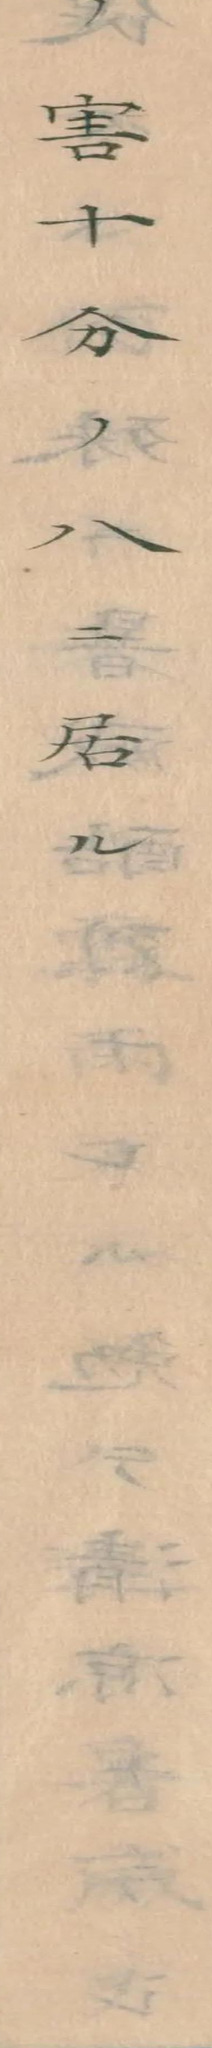ノ害十分ノ八ニ居ル
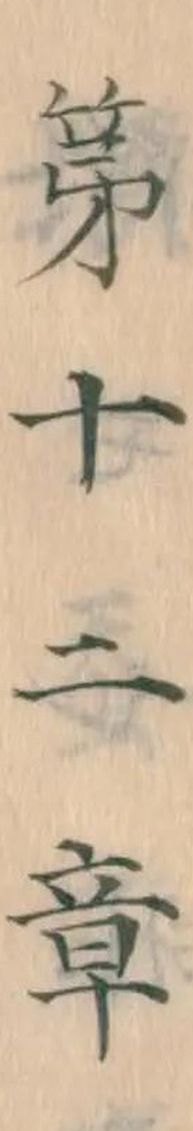第十二章
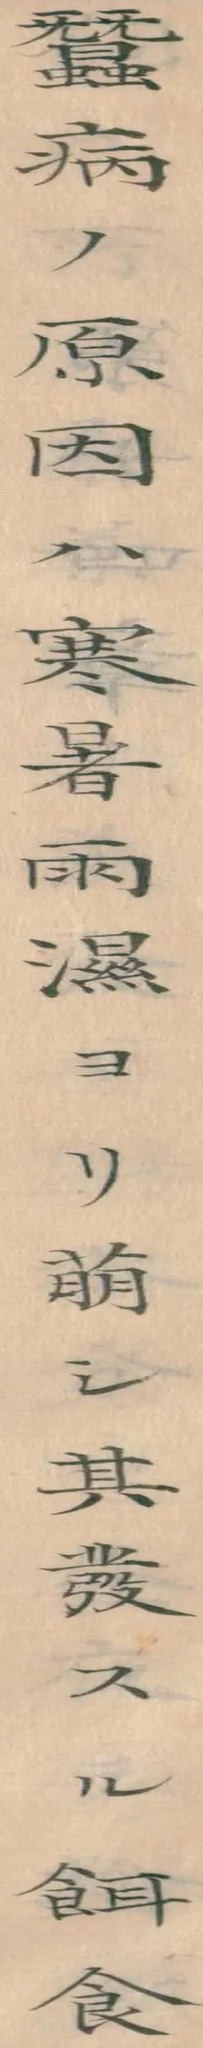蚕病ノ原因ハ寒暑雨湿ヨリ萌シ其発スル餌食
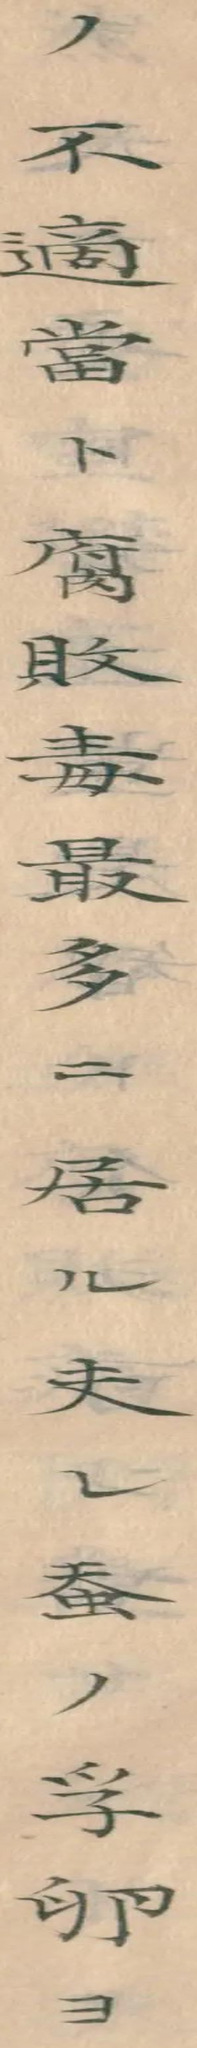ノ不適当ト腐敗毒最多ニ居ル夫レ蚕ノ孚卵ヨ
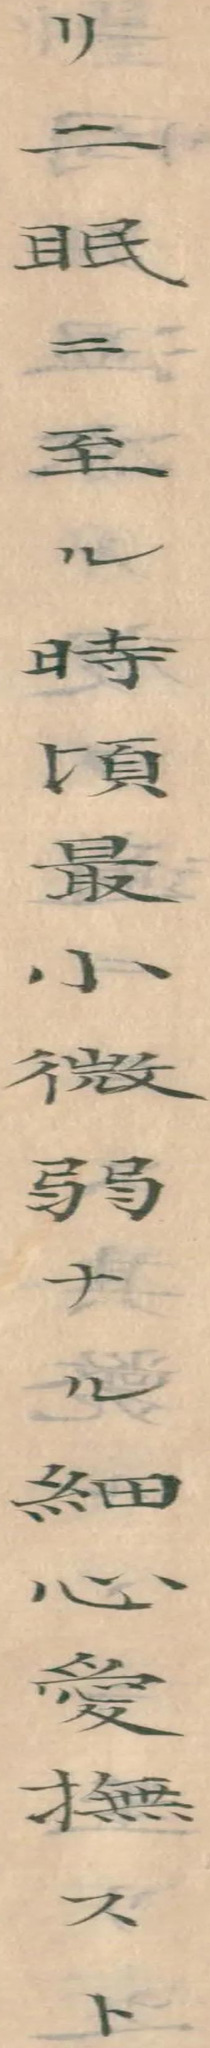リ二眠ニ至ル時頃最小微弱ナル細心愛撫スト
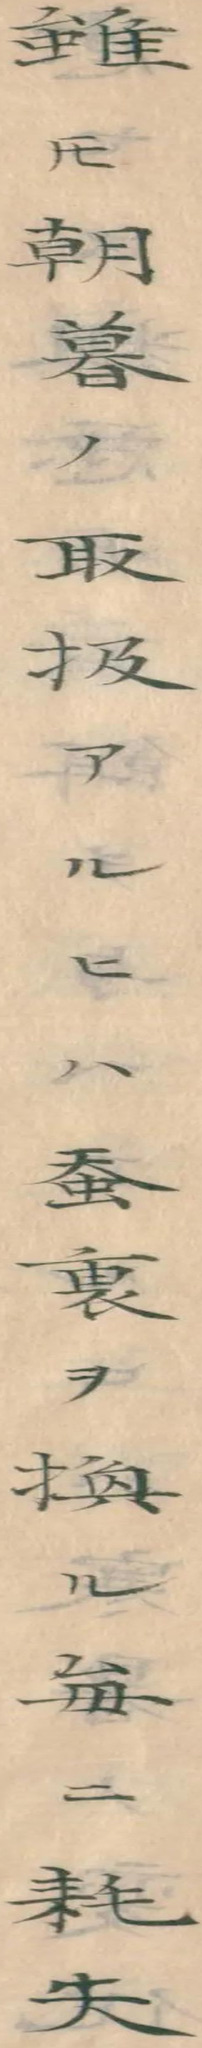雖トモ朝暮ノ取扱アルヒハ蚕裏ヲ換ル毎ニ耗失
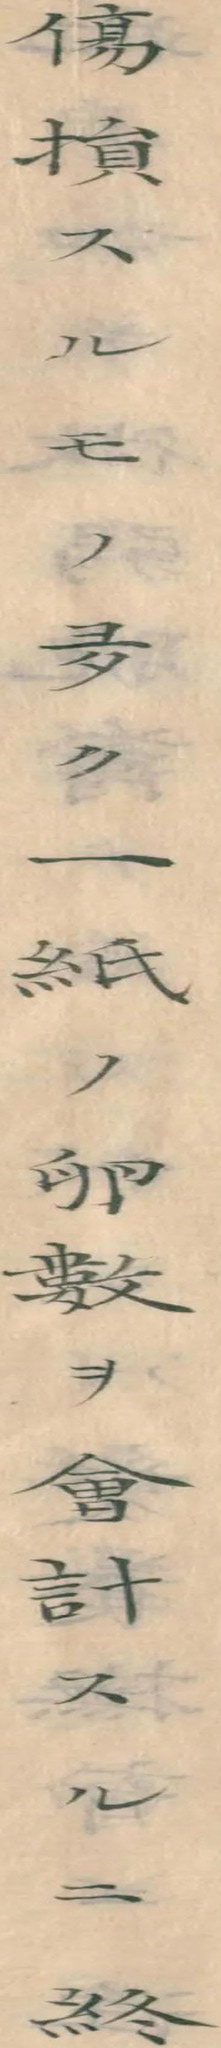傷損スルモノ多ク一紙ノ卵数ヲ会計スルニ終
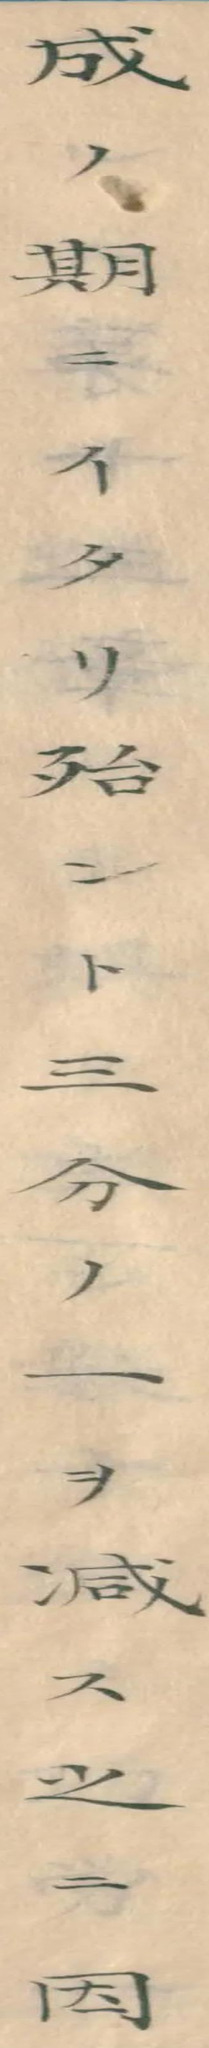成ノ期ニイタリ殆ント三分ノ一ヲ減ス之ニ因
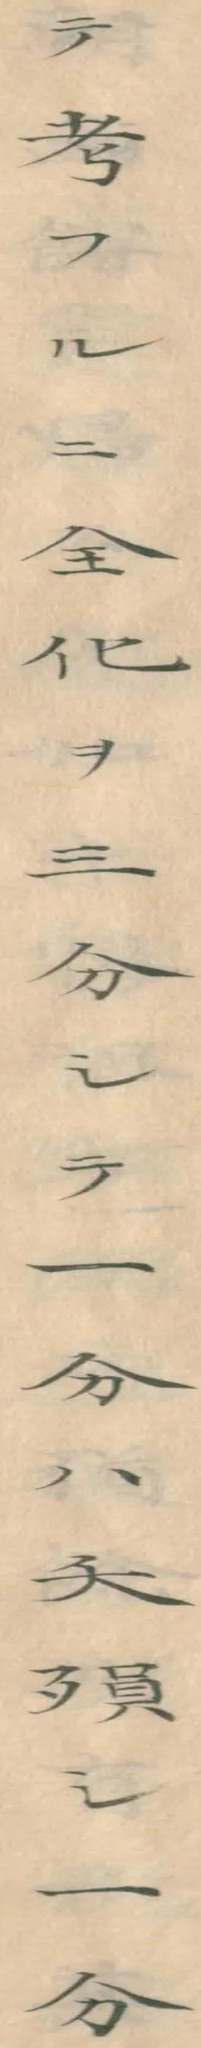テ考フルニ全化ヲ三分シテ一分ハ夭殞シ一分
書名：蚕桑集成
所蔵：国立国会図書館 National Diet Library, JAPAN
